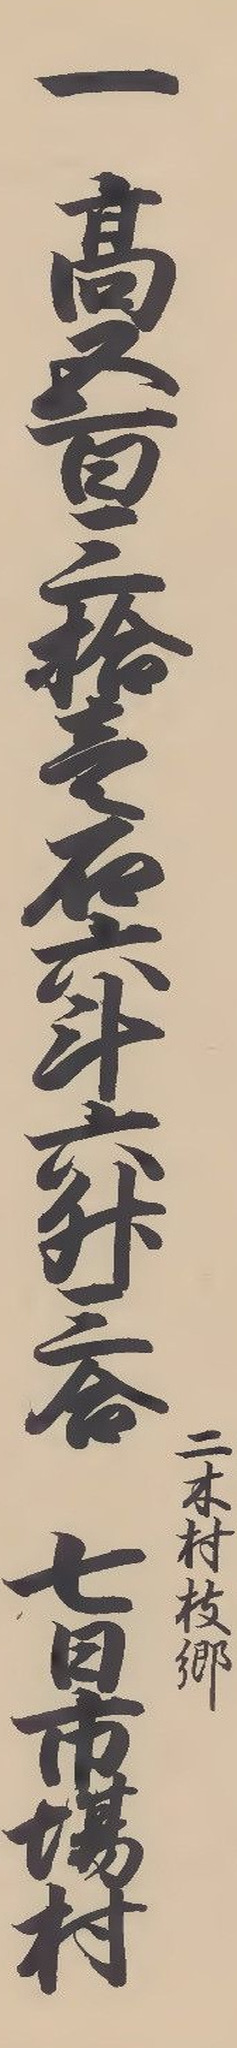一高五百三拾壱石六斗六升三合七日市場村
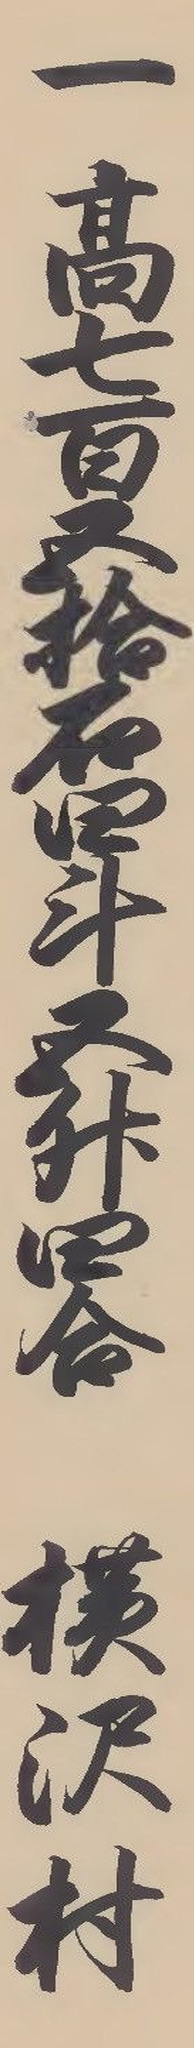一高七百五拾石四斗五升四合横沢村
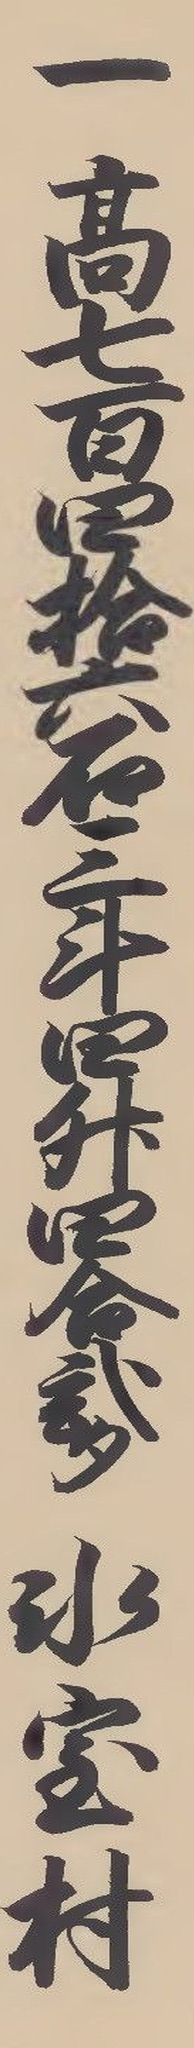一高七百四拾六石三斗四升四合弐勺氷室村
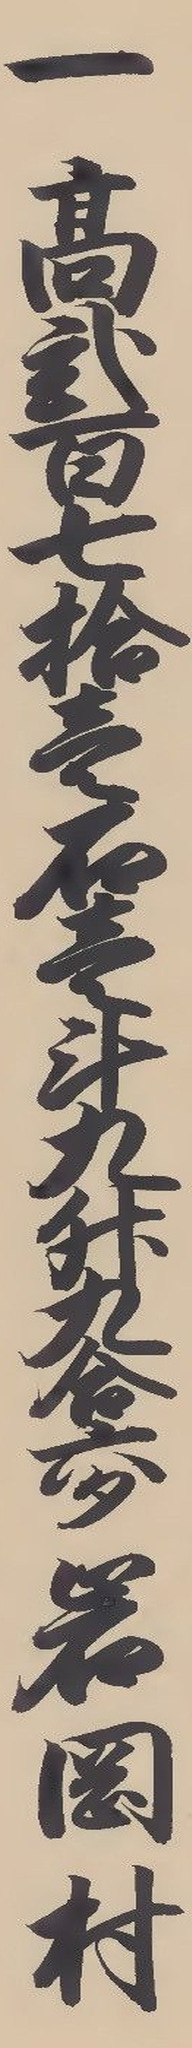一高弐百七拾壱石壱斗九升九合六勺岩岡村
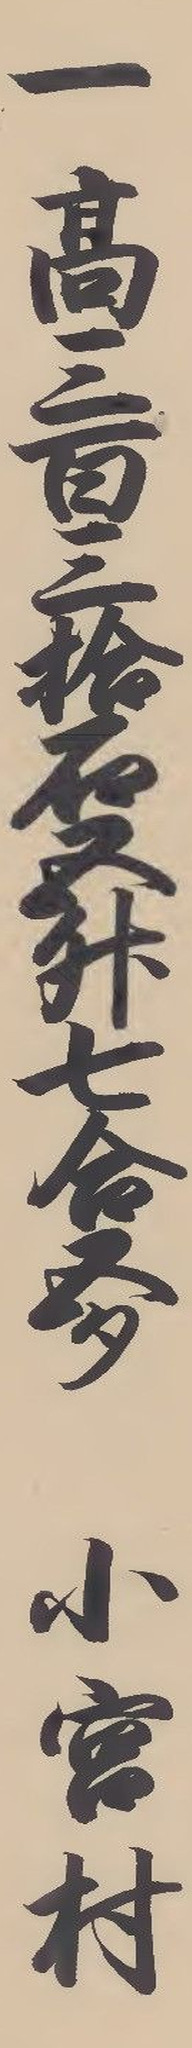一高三百三拾石五升七合五勺小宮村
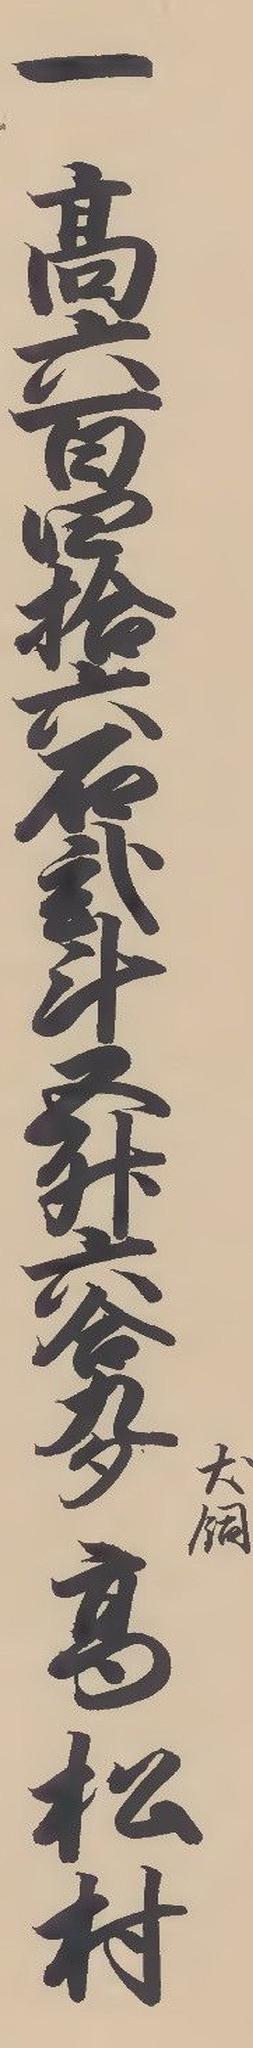一高六百四拾六石弐斗五升六匁九勺高松村
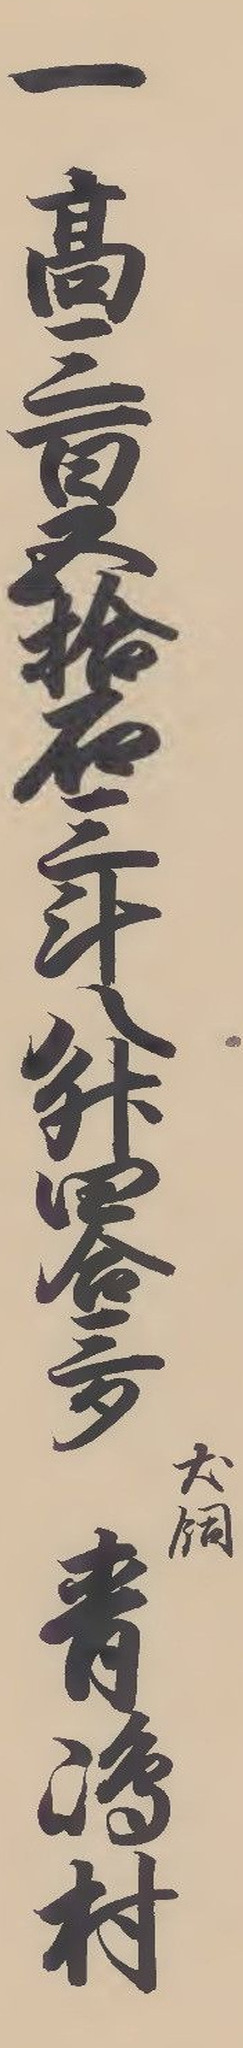一高三百五拾石三斗八升四合三勺青島村

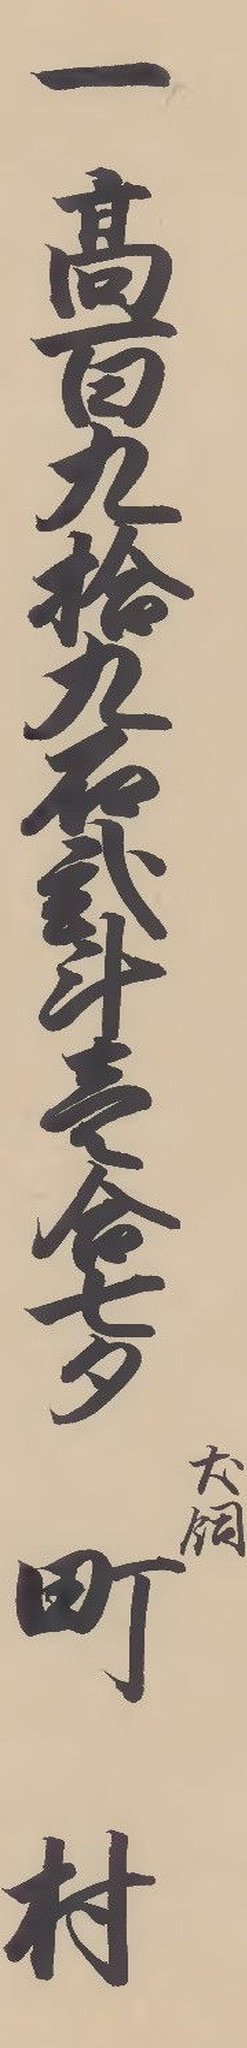一高百九拾九石弐斗壱合七勺町村
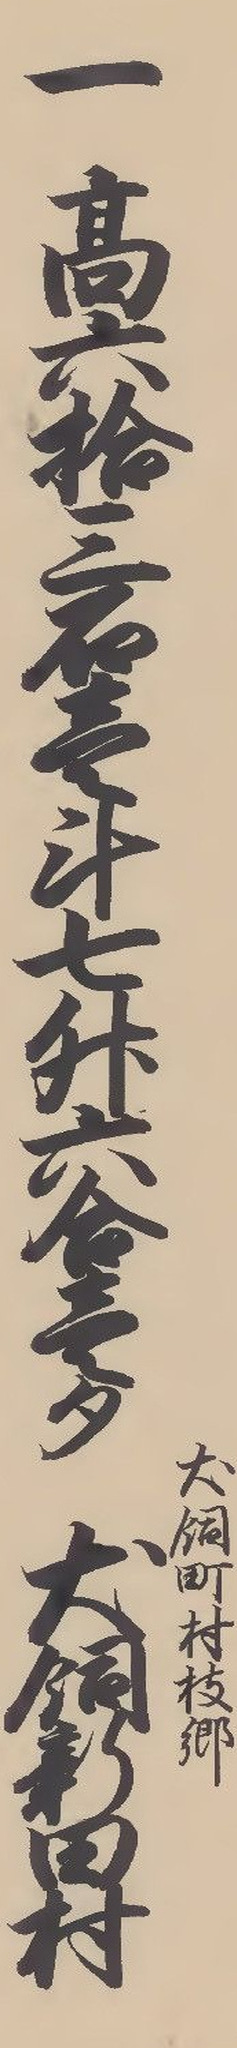一高六拾三石壱斗七升六合壱勺犬飼新田村
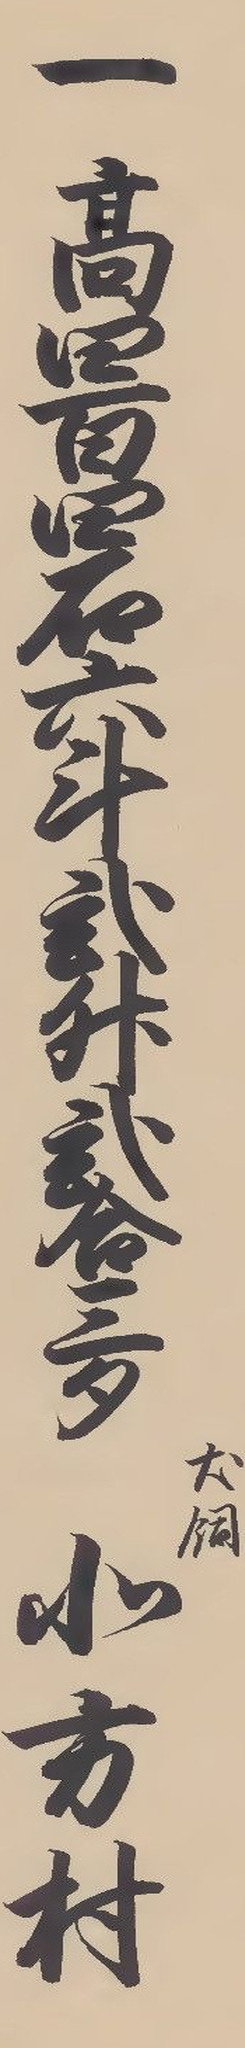一高四百四石六斗弐升弐合三勺北方村
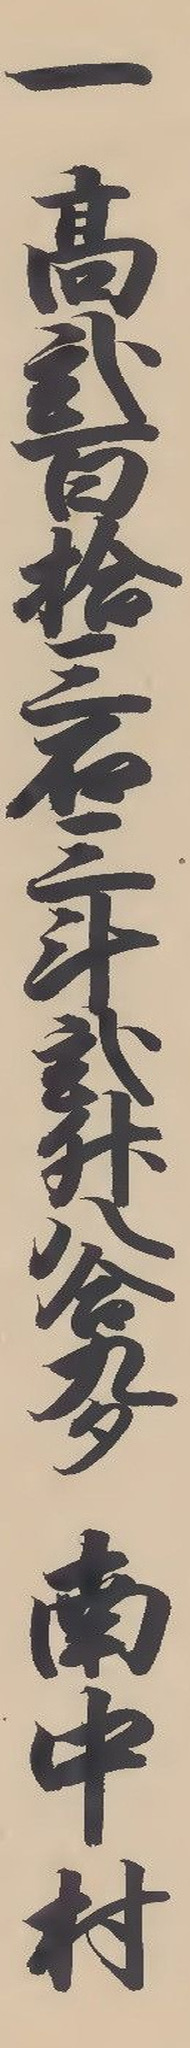一高弐百拾三石三斗弐升八合九勺南中村
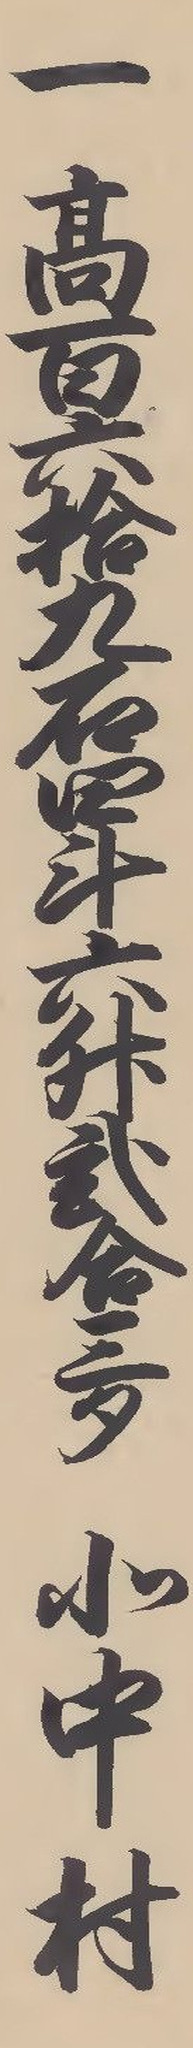一高百六拾九石四斗六升弐合三勺北中村
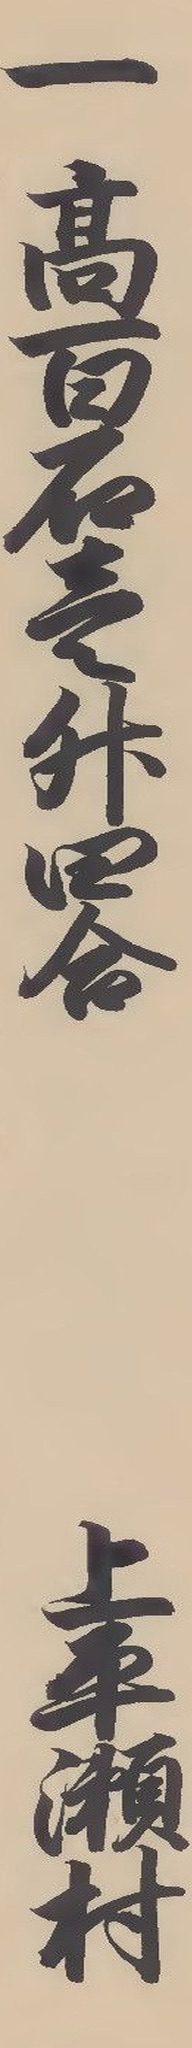一高百石壱升四合上平瀬村
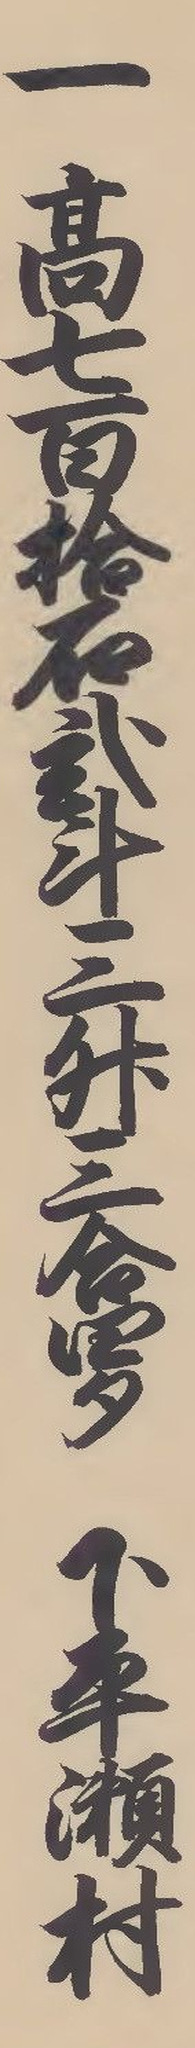一高七百拾石弐斗三升三合四勺下平瀬村

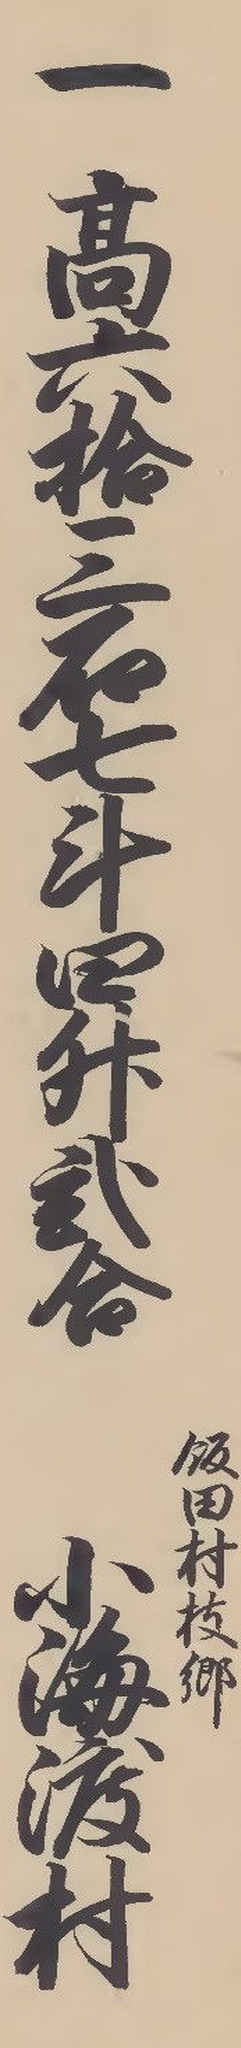一高六拾三石七斗四升弐合小海渡村
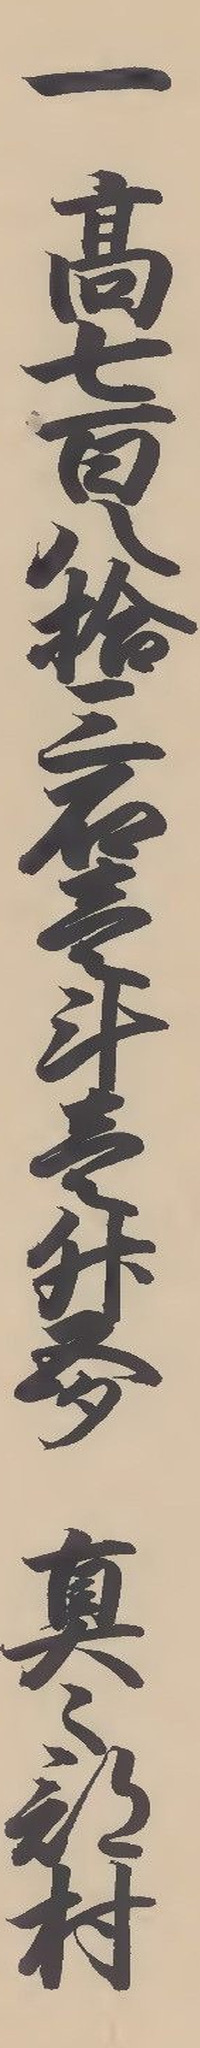一高七百八拾三石壱斗壱升五勺真々部村
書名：信濃国郷帳
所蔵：国立公文書館 National Archives of Japan
